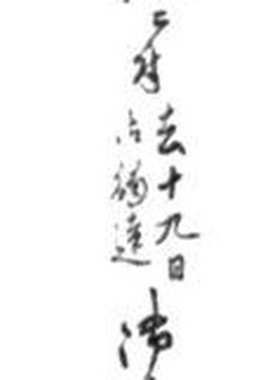御触達
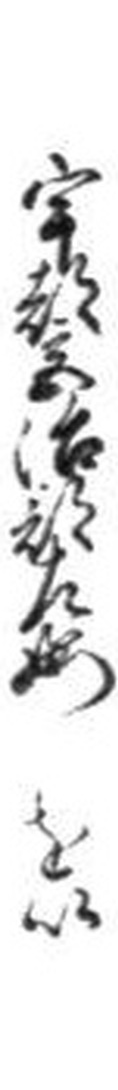宇都宮治部左衛門を以
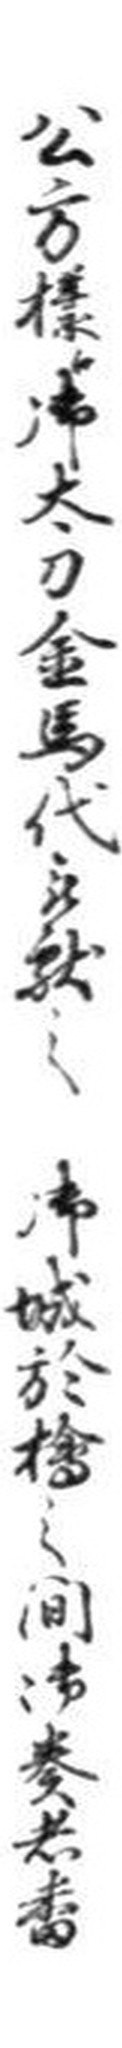公方様江御太刀金馬代被献之御城於檜之間御奏者番
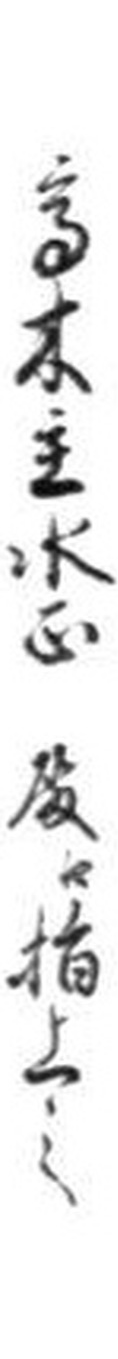高木主水正殿江指上之
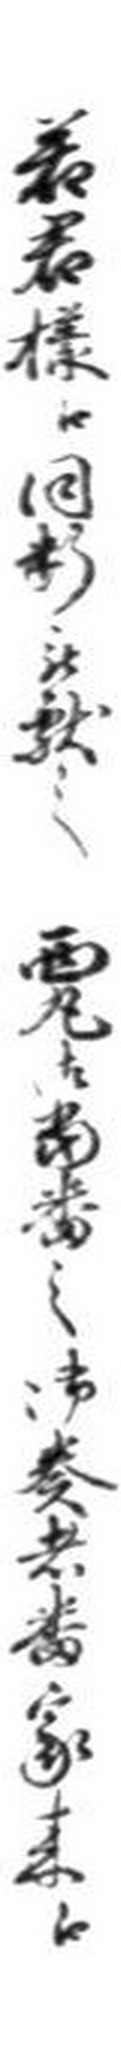若君様江同断被献之西丸御当番之御奏者番家来江
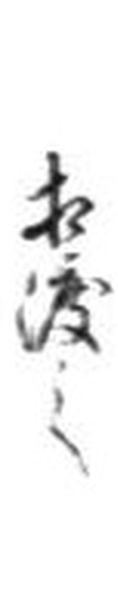相渡之
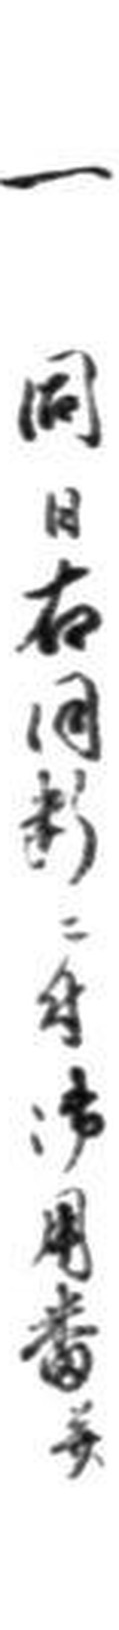一同日右同断ニ付御用番并
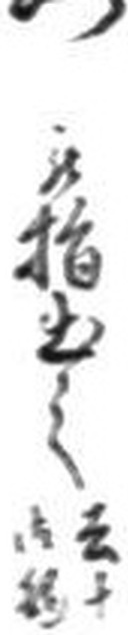看被指出之
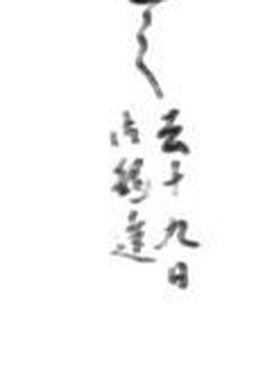御触達
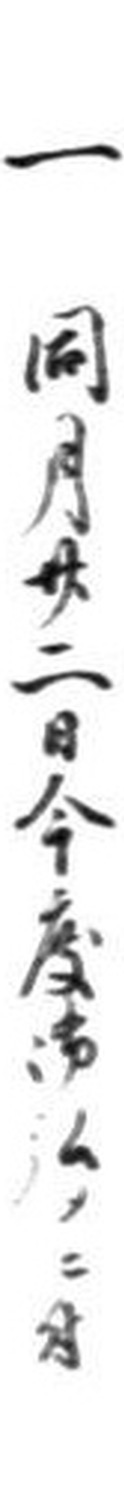一同月廿二日今度御弘メニ付
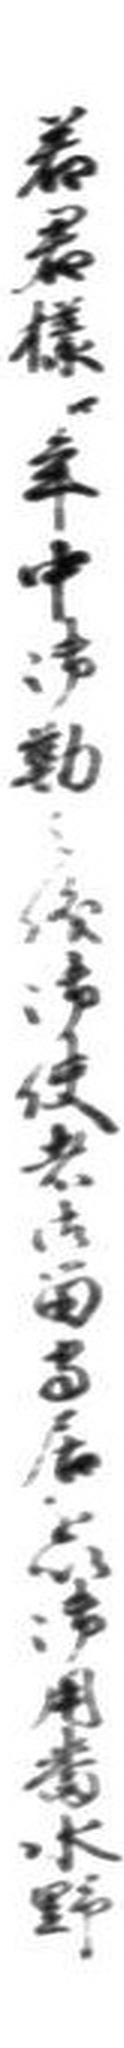若君様江年中御勤之儀御使者御留守居を以御用番水野
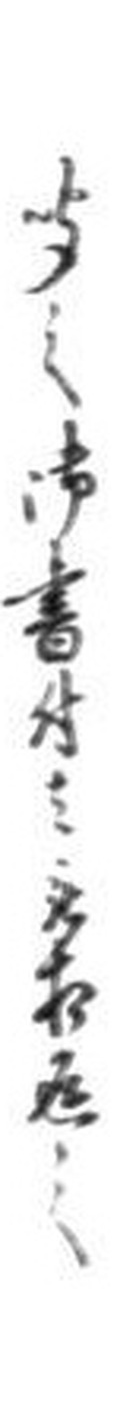聞之御書付者被相返之
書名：家譜 三十八 宗矩公 従享保九年五月到享保九年十二月
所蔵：福井県文書館 Fukui Prefectural Archives
